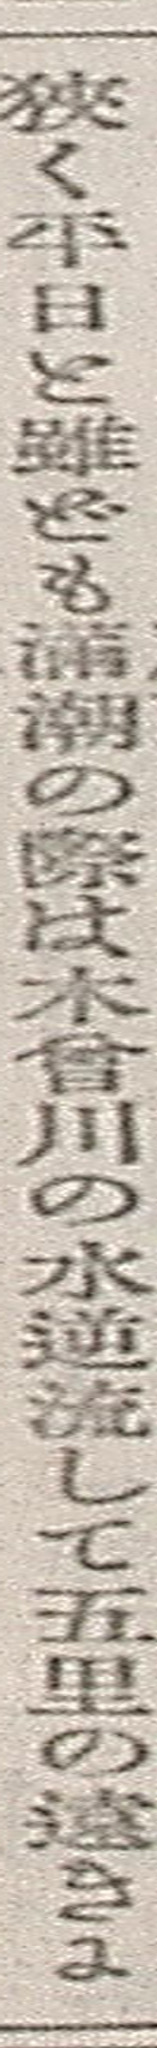狭く平日と雖ども満潮の際は木曽川の水逆流して五里の遠きに
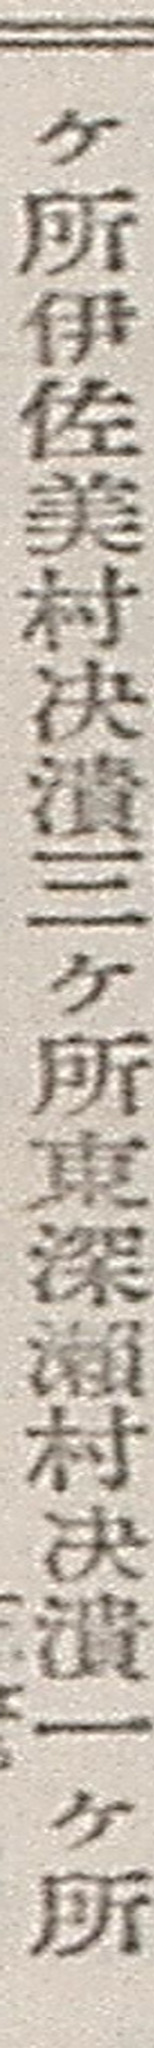ヶ所伊佐美村决潰三ヶ所東深瀬村决潰一ヶ所
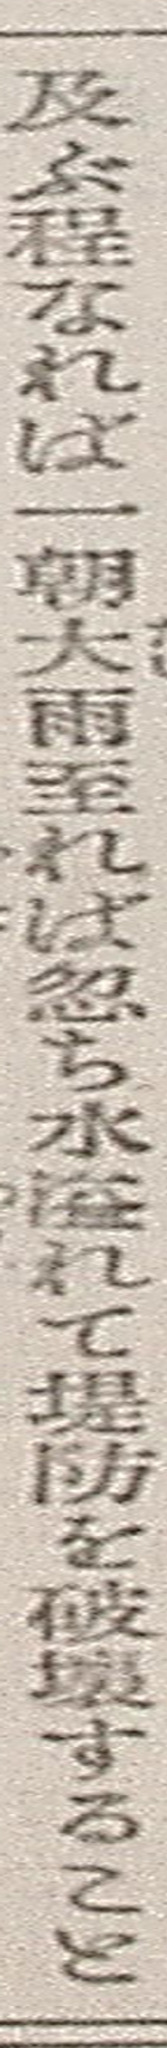及ぶ程なれば一朝大雨至れば忽ち水溢れて堤防を破壊すること
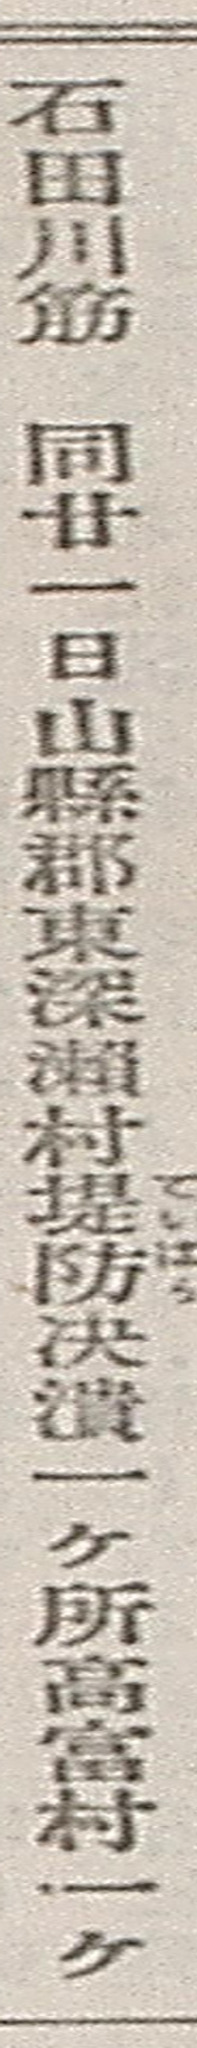石田川筋同廿一日山縣郡東深瀬村堤防决潰一ヶ所高富村一ヶ
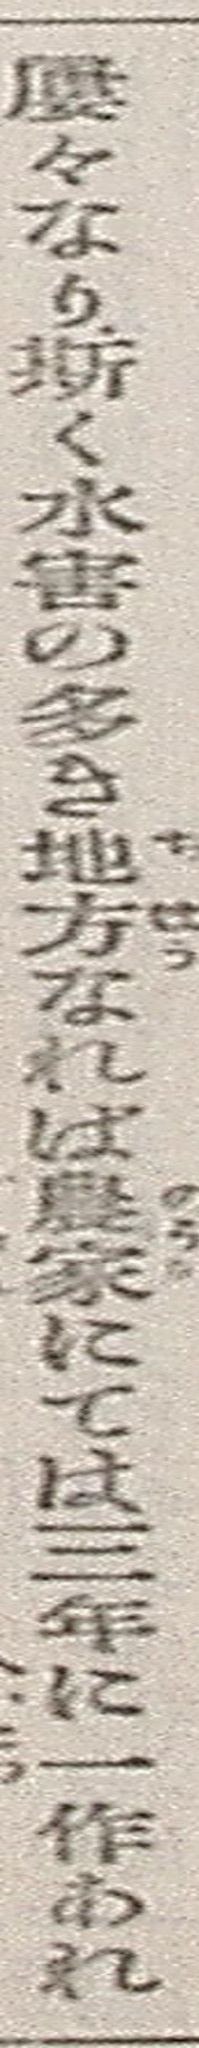屡々なり斯く水害の多き地方なれば農家にては三年に一作あれ
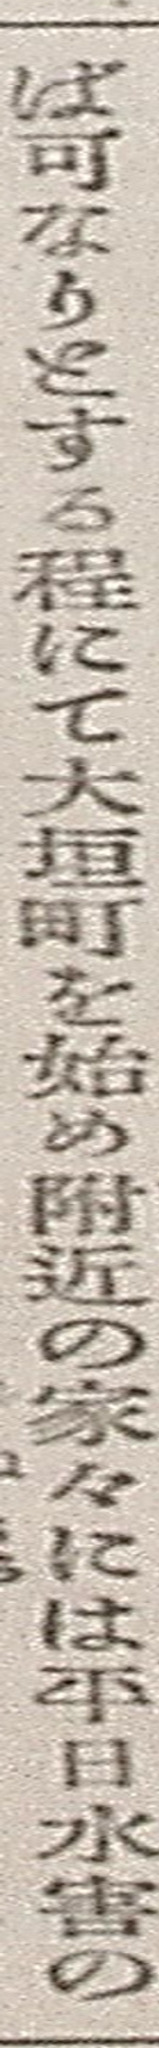ば可なりとする程にて大垣町を始め附近の家々には平日水害の
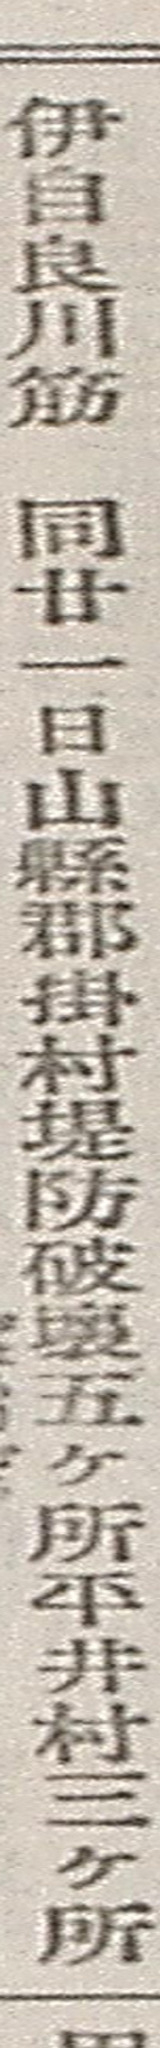伊自良川筋同廿一日山縣郡掛村堤防破壊五ヶ所平井村三ヶ所
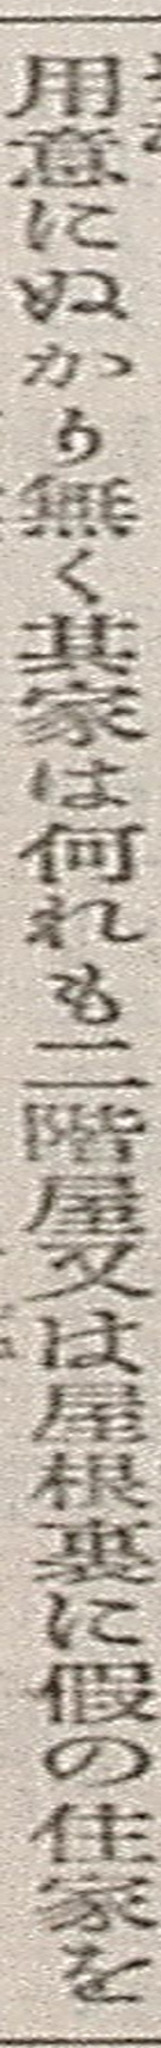用意にぬかり無く其家は何れも二階屋又は屋根裏に仮の住家を
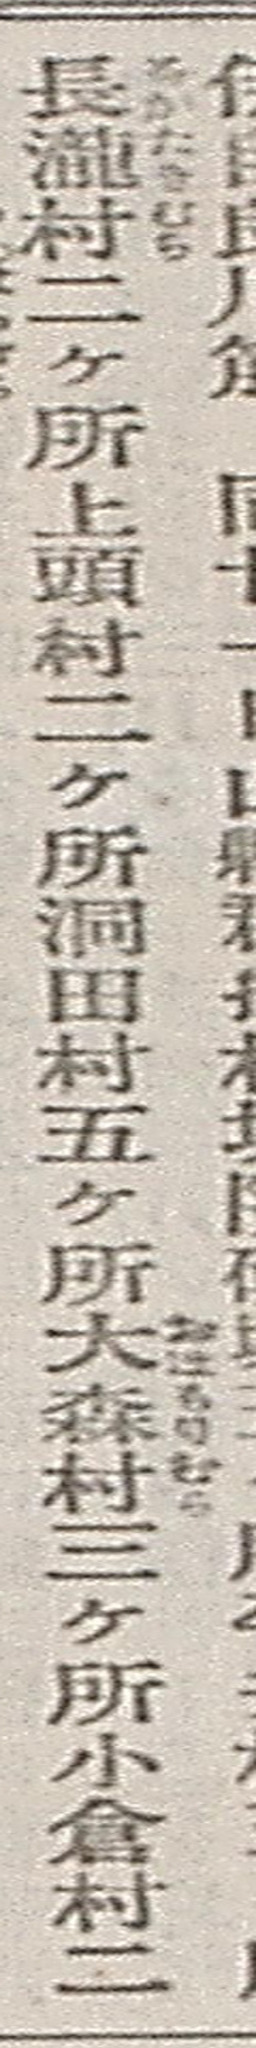長瀧村二ヶ所上頭村二ヶ所洞田村五ヶ所大森村三ヶ所小倉村二
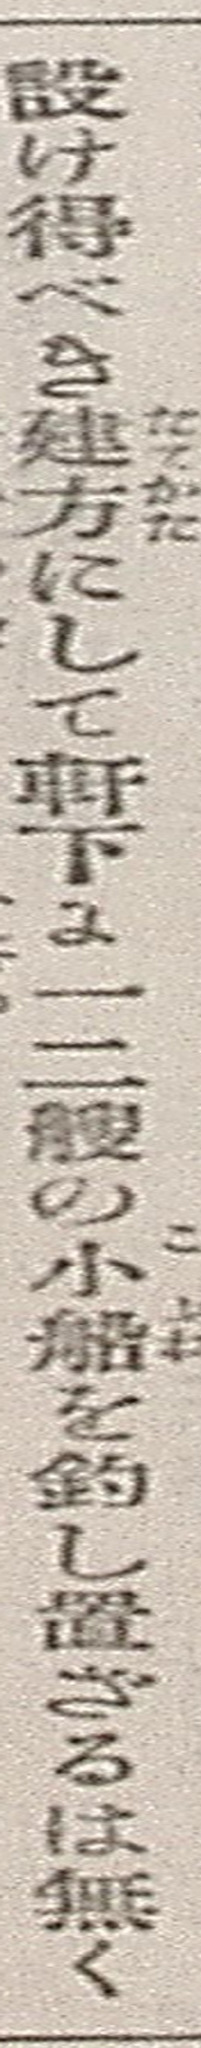設け得べき建方にして軒下に一二艘の小舟を釣し置ざるは無く
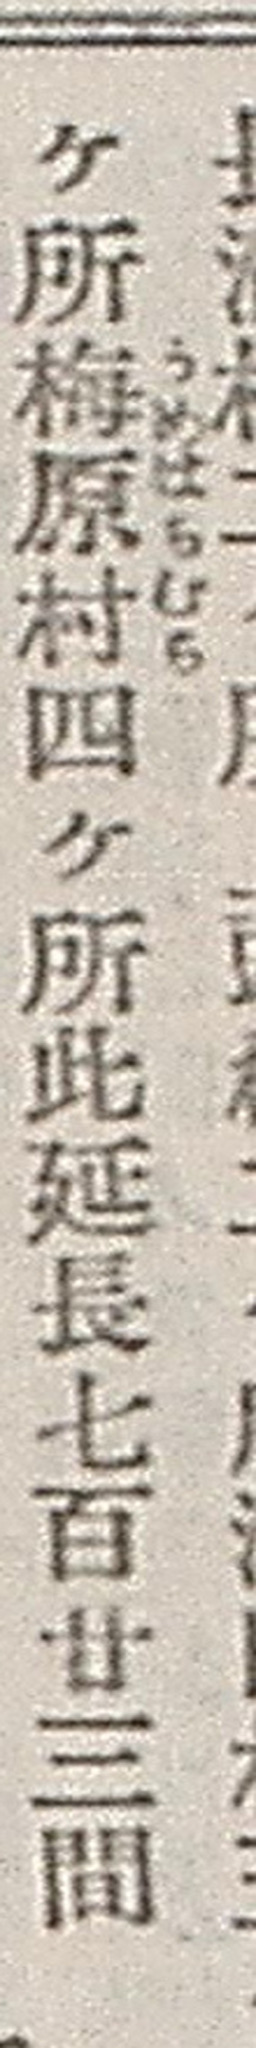ヶ所梅原村四ヶ所此延長七百廿三間
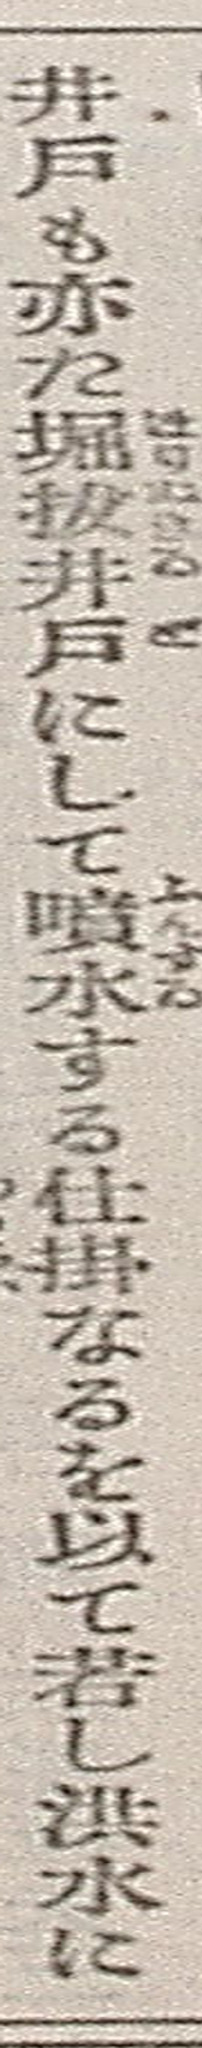井戸も亦た掘抜井戸にして噴水する仕掛なるを以て若し洪水に
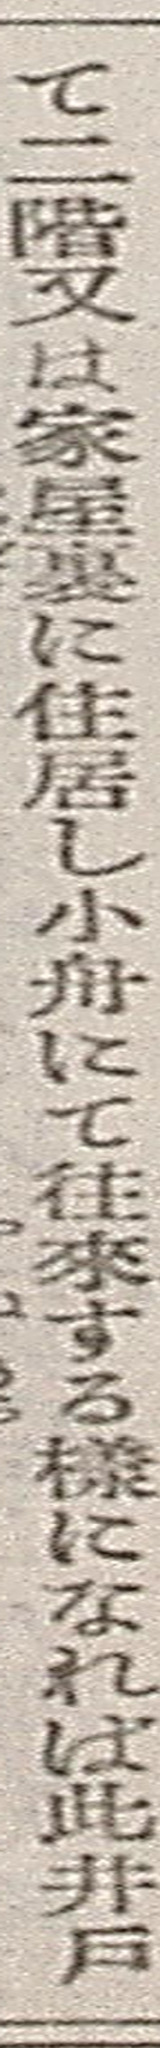て二階又は家屋裏に住居し小舟にて往来する様になれば此井戸
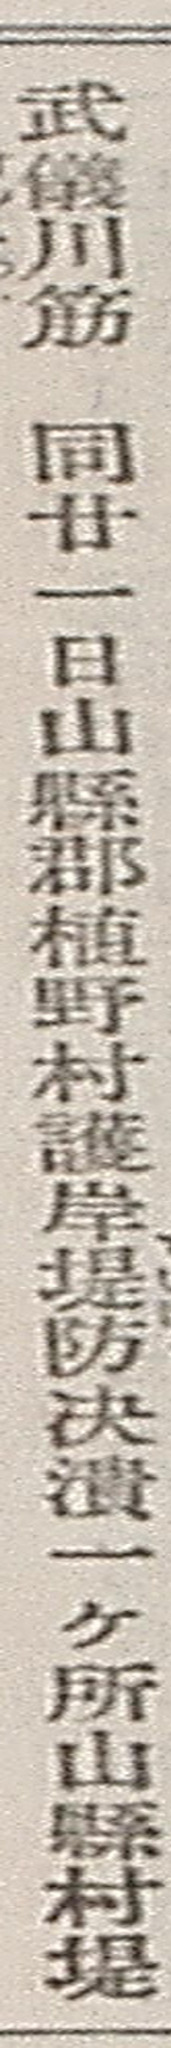武儀川筋同廿一日山形郡植野村護岸堤防决潰一ヶ所山縣村堤
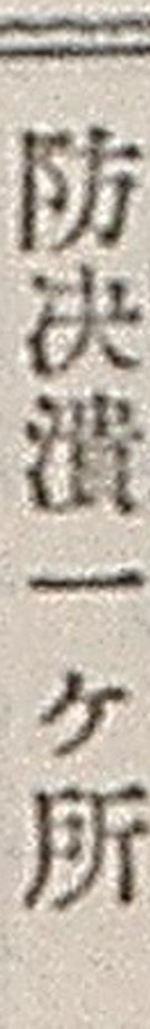防决潰一ヶ所
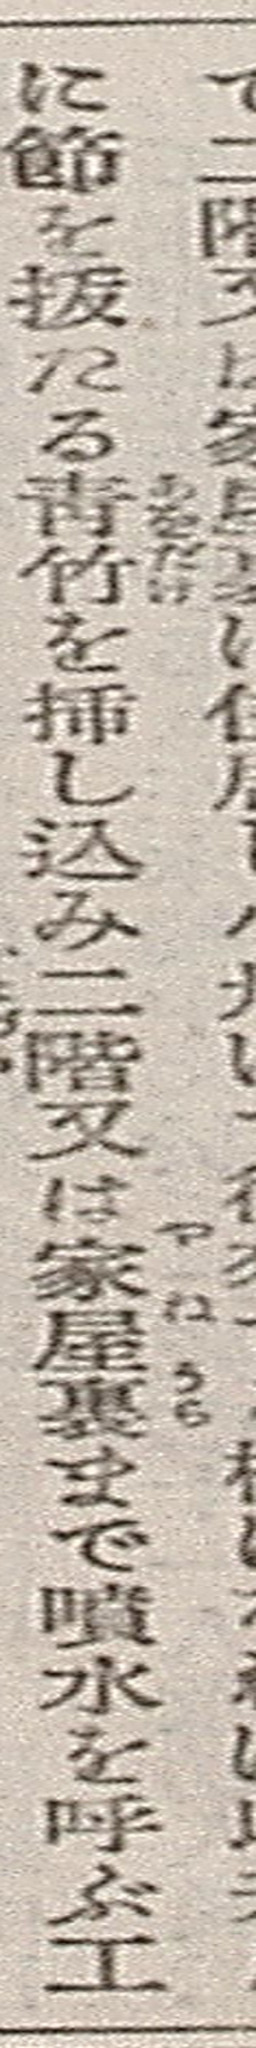に節を抜たる青竹を挿し込み二階又は屋根裏まで噴水を呼工
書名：風俗畫報臨時増刊第百二十六號　洪水被害録（中）
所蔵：東京大学地震研究所図書室 Earthquake Research Institute Library, The University of Tokyo, JAPAN
